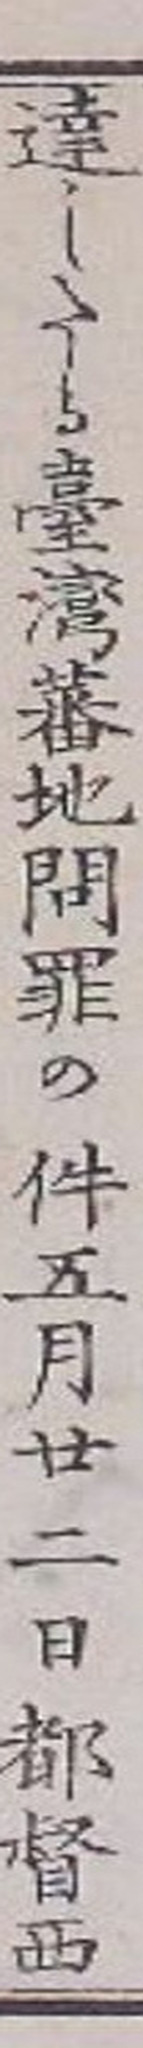達したる台湾蕃地問罪の件五月廿二日都督西
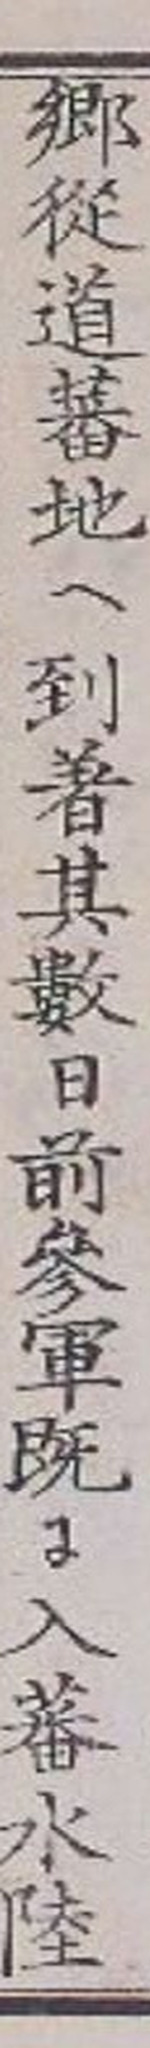郷従道蕃地へ到着其数日前参軍既に入蕃水陸

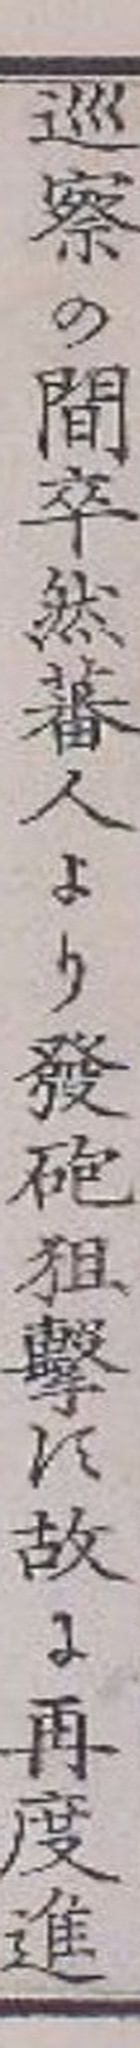巡察の間卒然蕃人より発砲狙撃す故に再度進
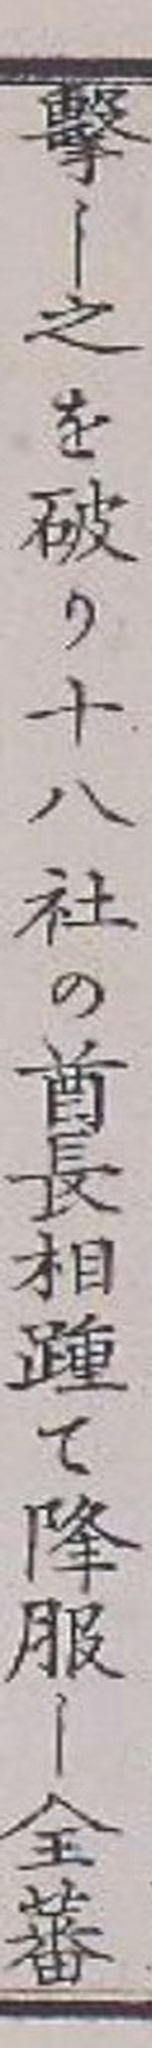撃し之を破り十八社の首長相踵て降伏し全蕃
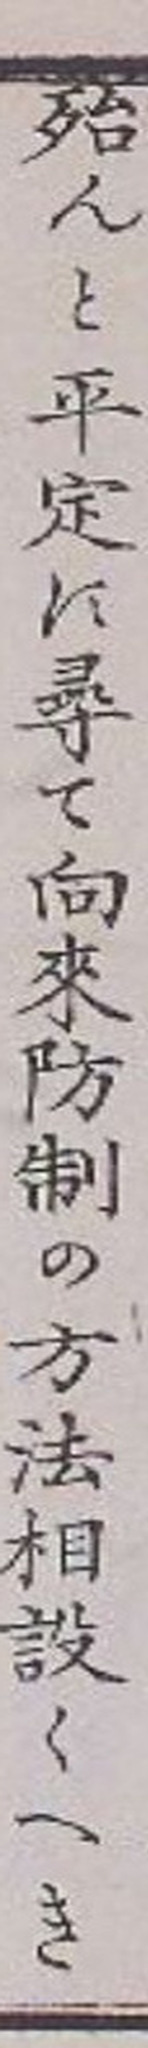殆んと平定す尋て向来防制の方法相設くへき
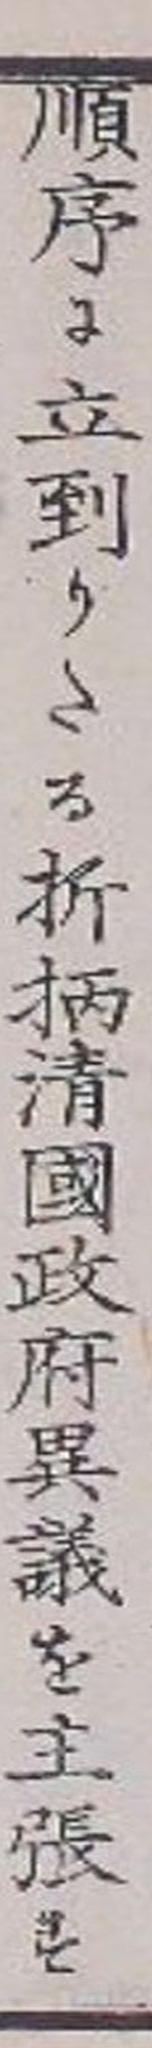順序に立到りたる折柄清国政府意議を主張す
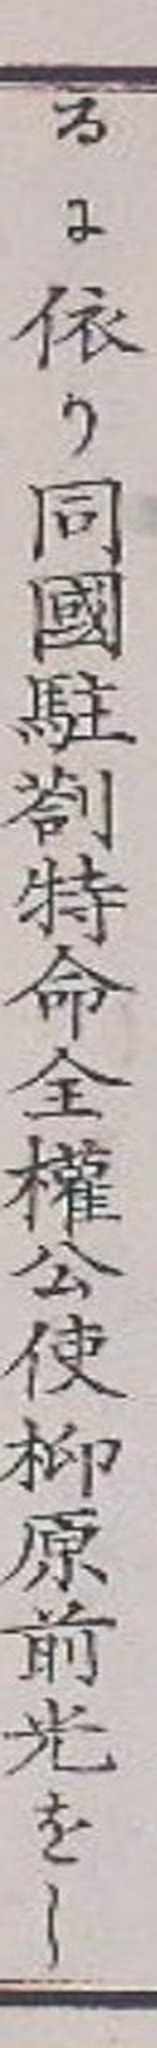るに依り同国駐箚特命全権公使柳原前光をし
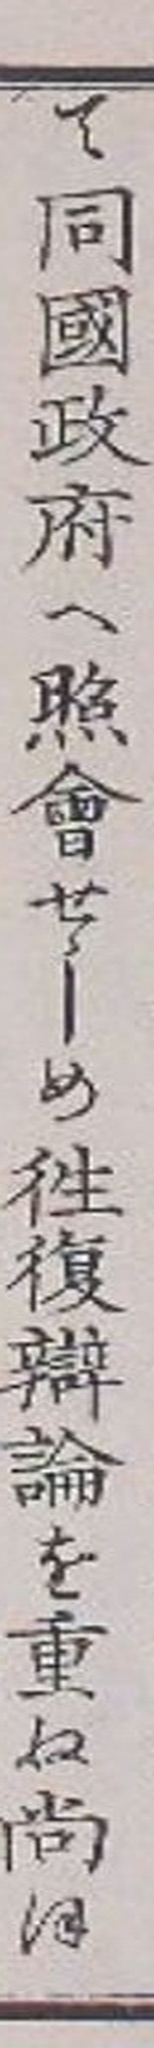て同国政府へ照会せしめ往復弁論を重ね尚ほ
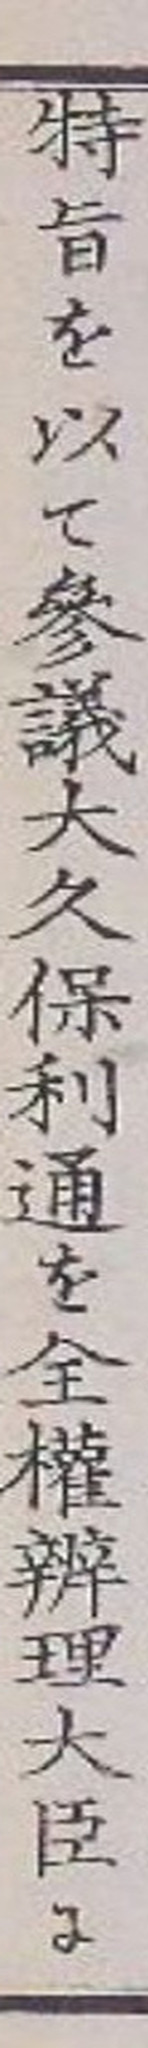特旨を以て参議大久保利通を全権弁理大臣に
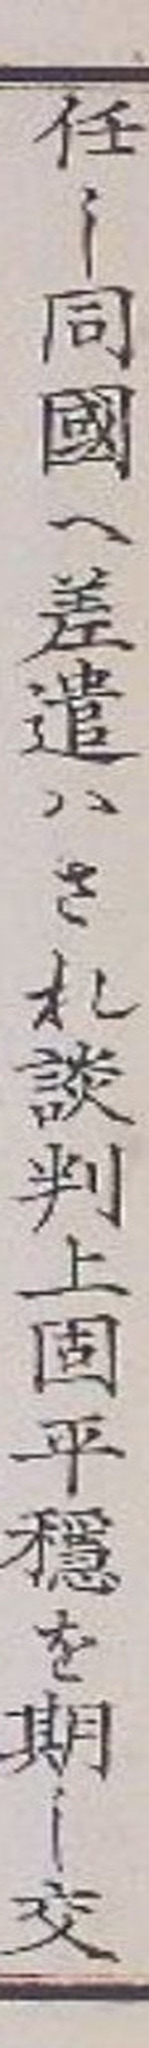任し同国へ差遣はされ談判上固平穏を期し交
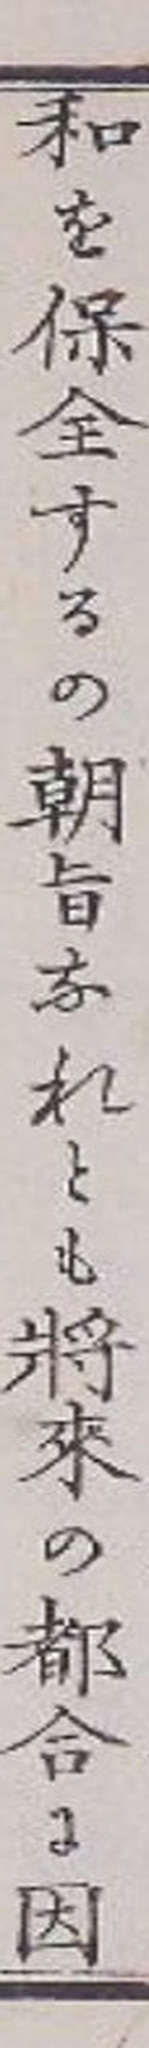和を保全するの朝旨なれとも将来の都合に因
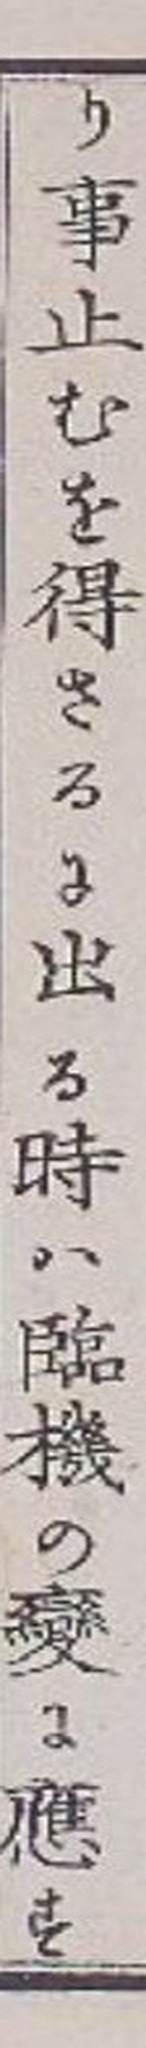り事止むを得さるに出る時は臨機の変に応す
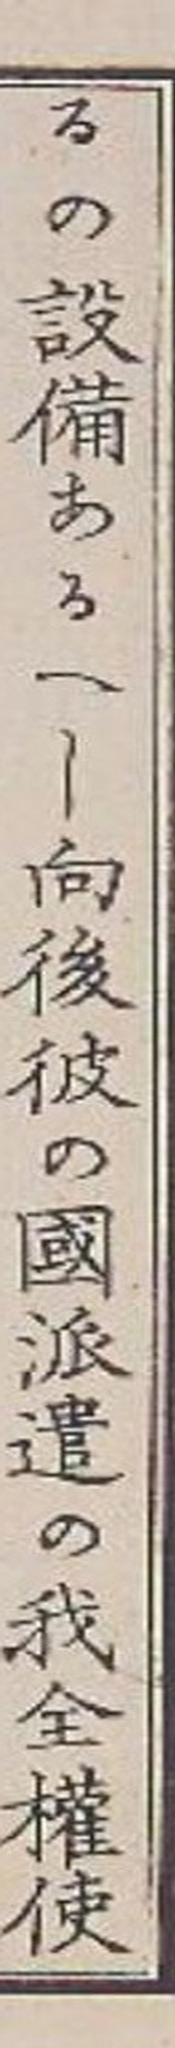るの設備あるへし向後彼の国派遣の我全権使
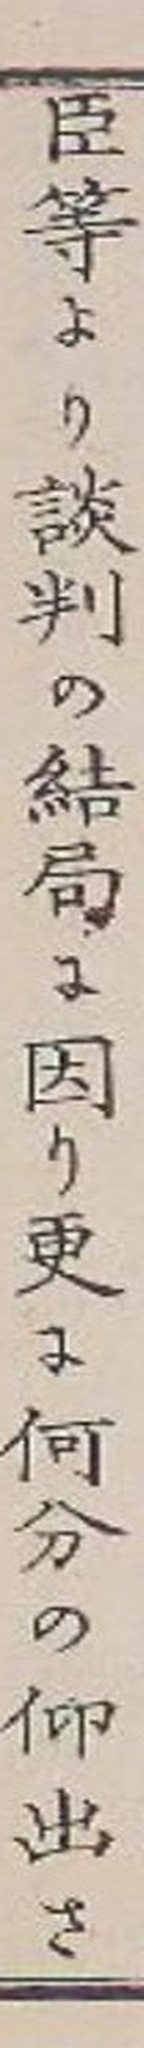臣等より談判の結局に因り更に何分の仰出さ
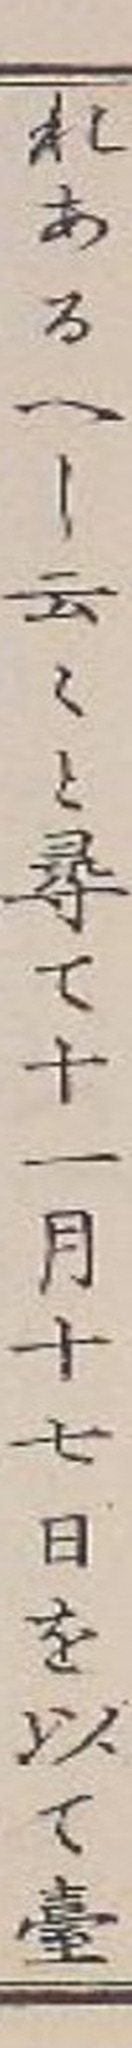れあるへし云々と尋て十一月十七日を以て台
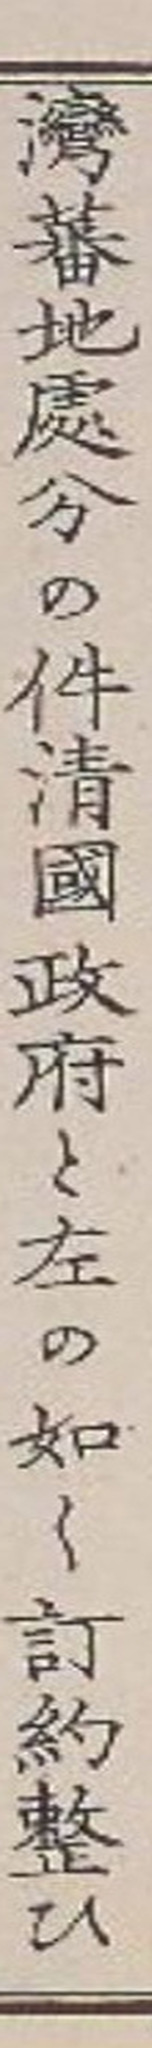湾蕃地処分の件清国政府と左の如く訂約整ひ
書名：南島紀事 下
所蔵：University of the Ryukyus Library
